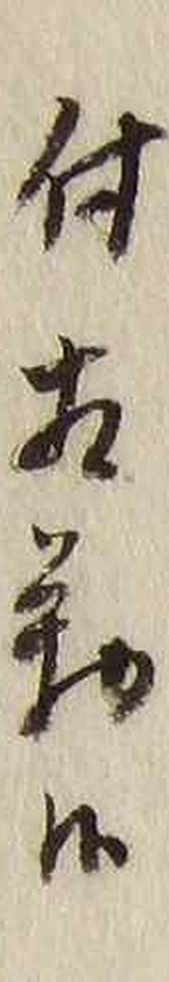付相勤候
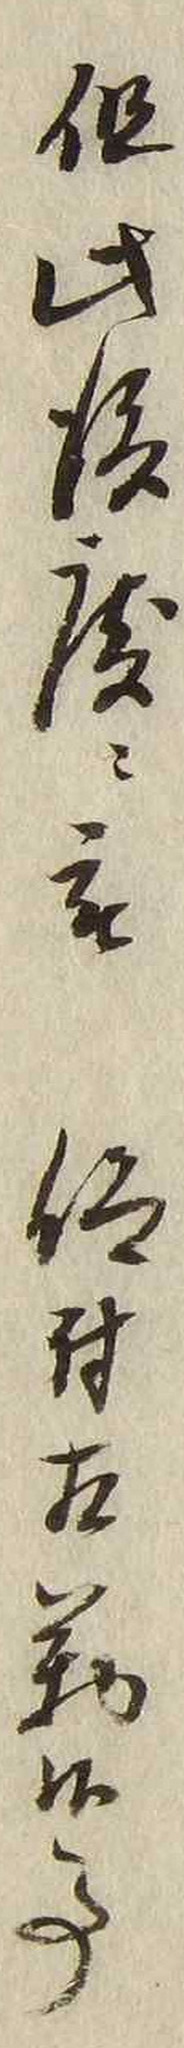但此後度々被仰付相勤候事

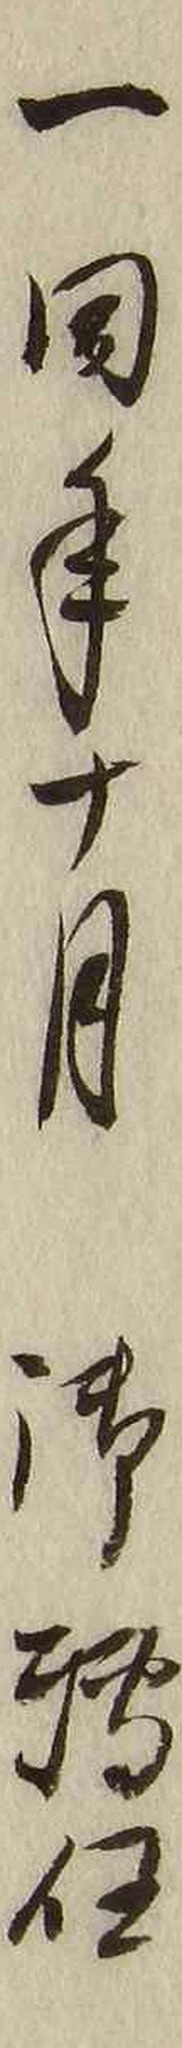一同年十月御転任
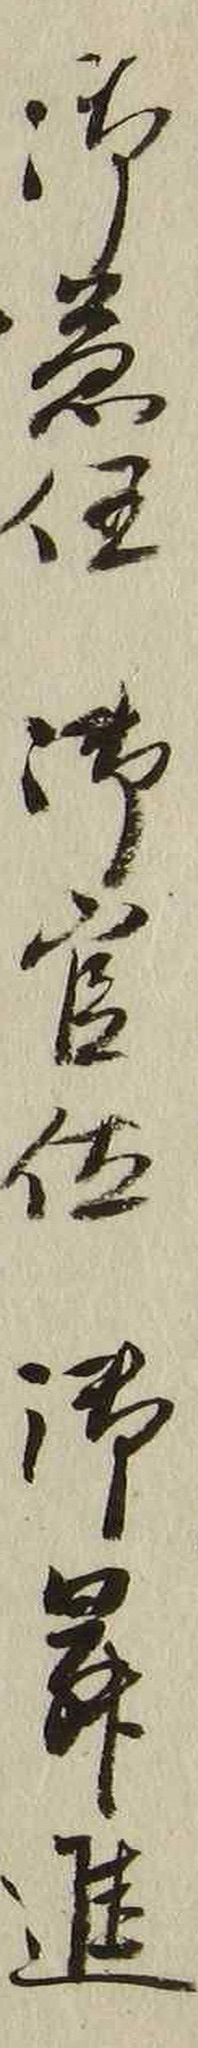御兼任御官位御昇進
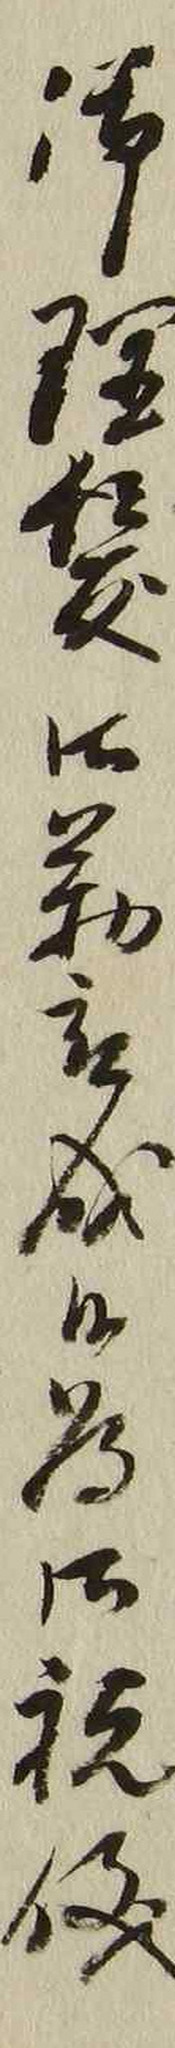御理髪御勤被成候為御祝儀
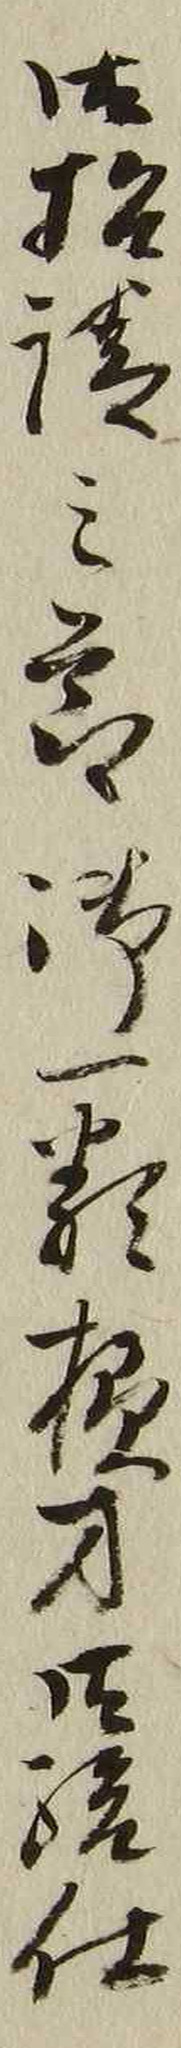御招請之節御一類様方御給仕
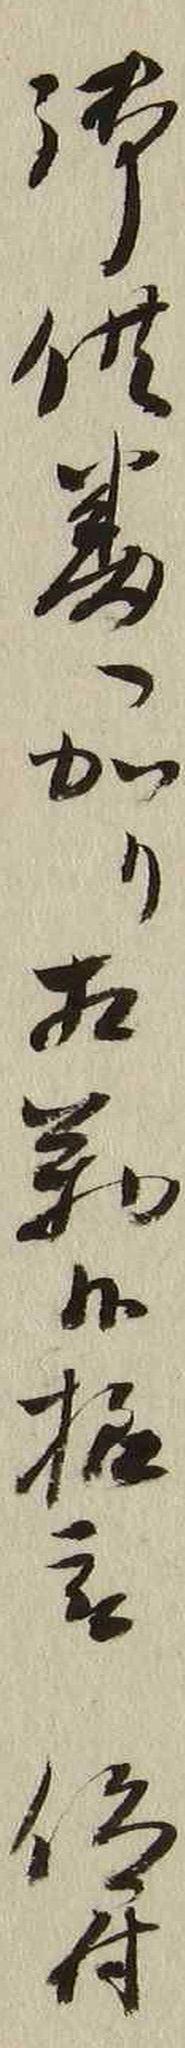御供番へ加り相勤候様被仰付
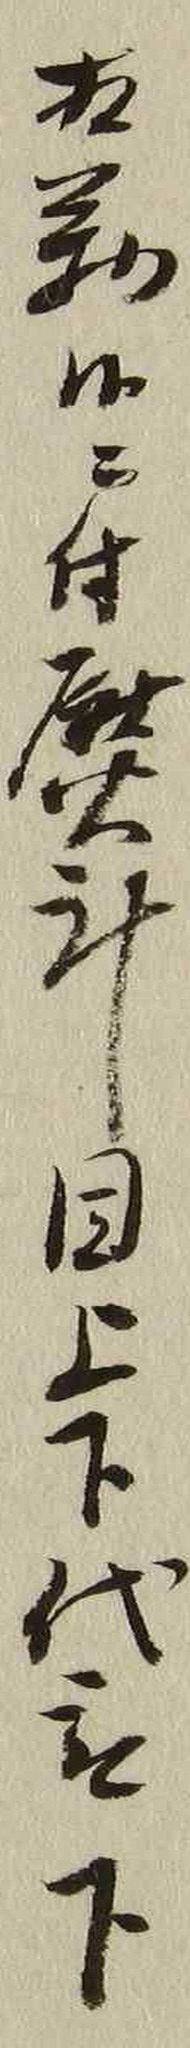相勤候ニ付熨斗目上下代被下
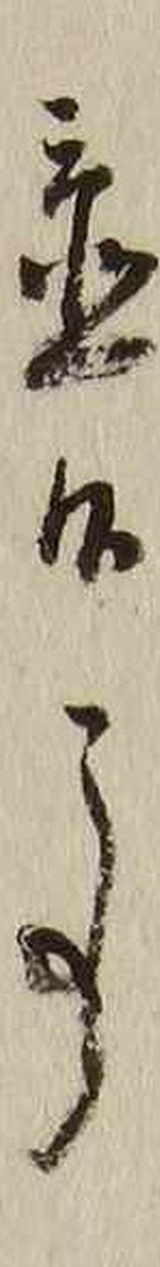置候事
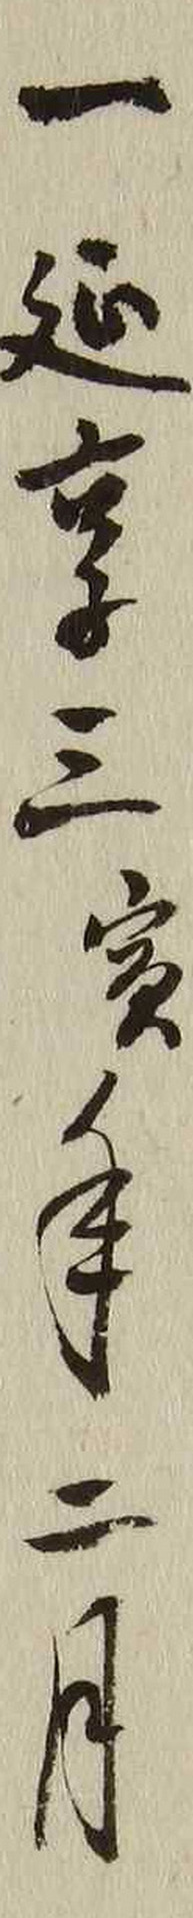一延享三寅年二月
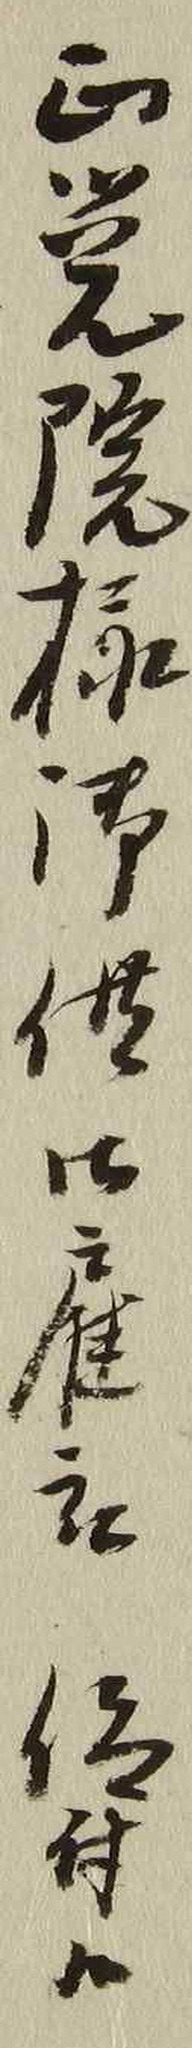正覚院様御供御雇被仰付候
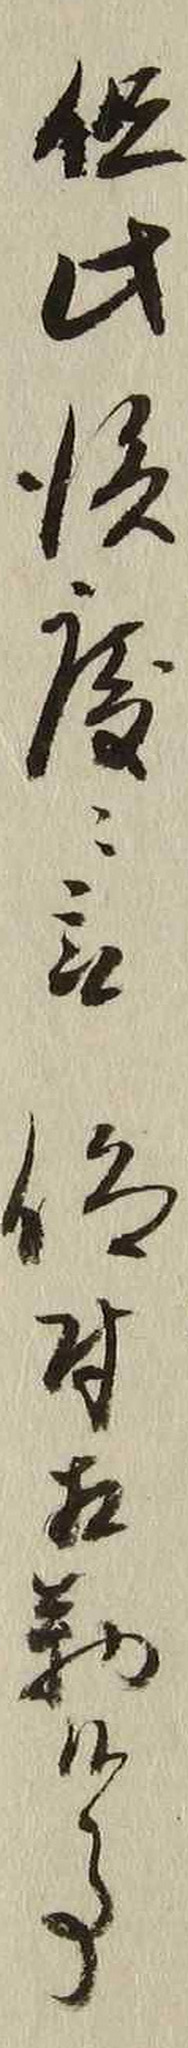但此後度々被仰付相勤候事
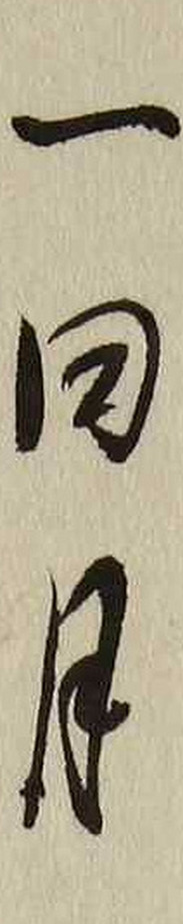一同月
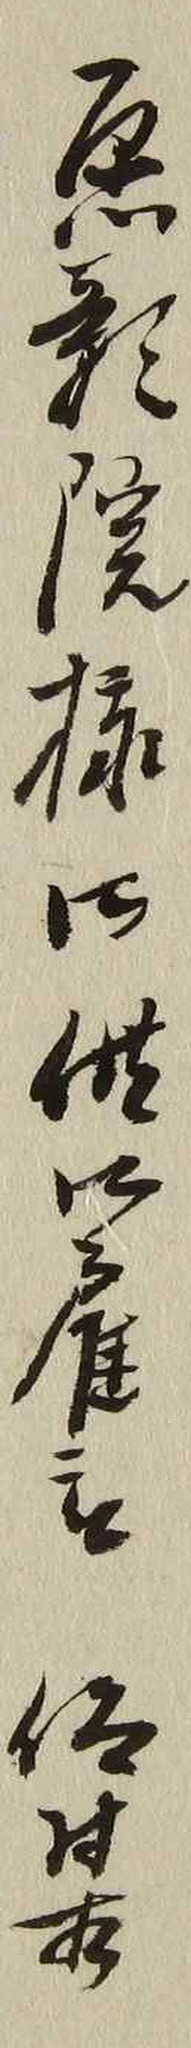正覚院様御供御雇被仰付候
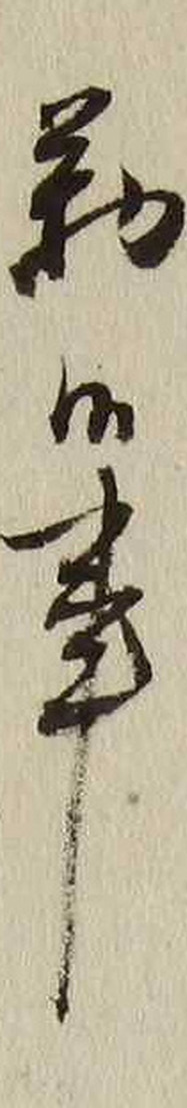勤候事
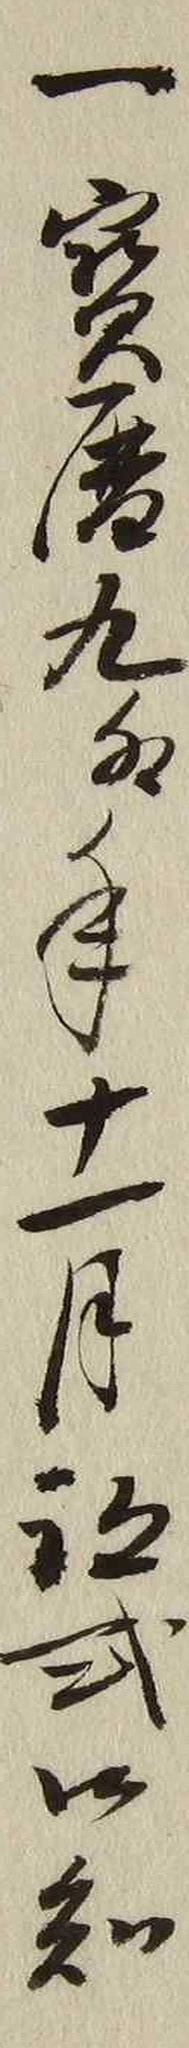一宝暦九卯年十一月跡式御知
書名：諸士系譜　巻之355　す之部5
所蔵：会津若松市立会津図書館
